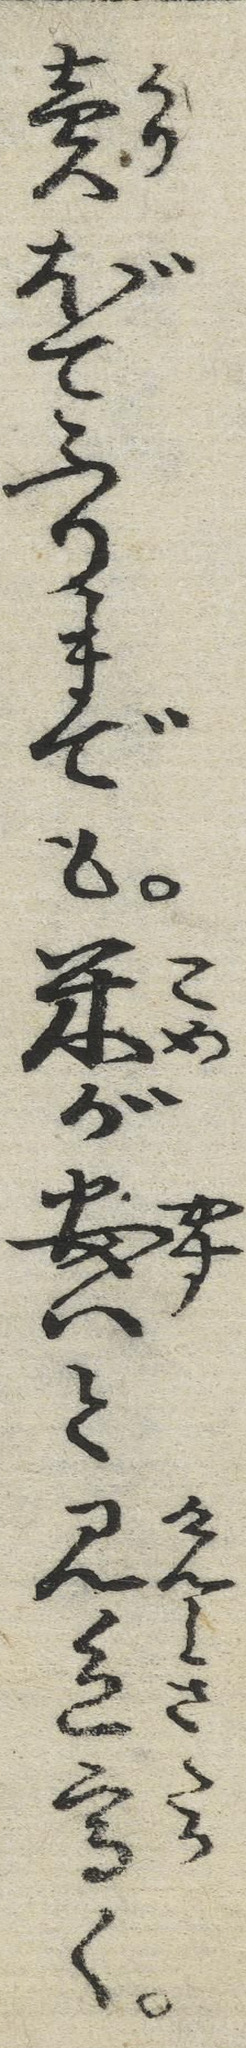売ぼてふりまでも。米が安いと見色高く。
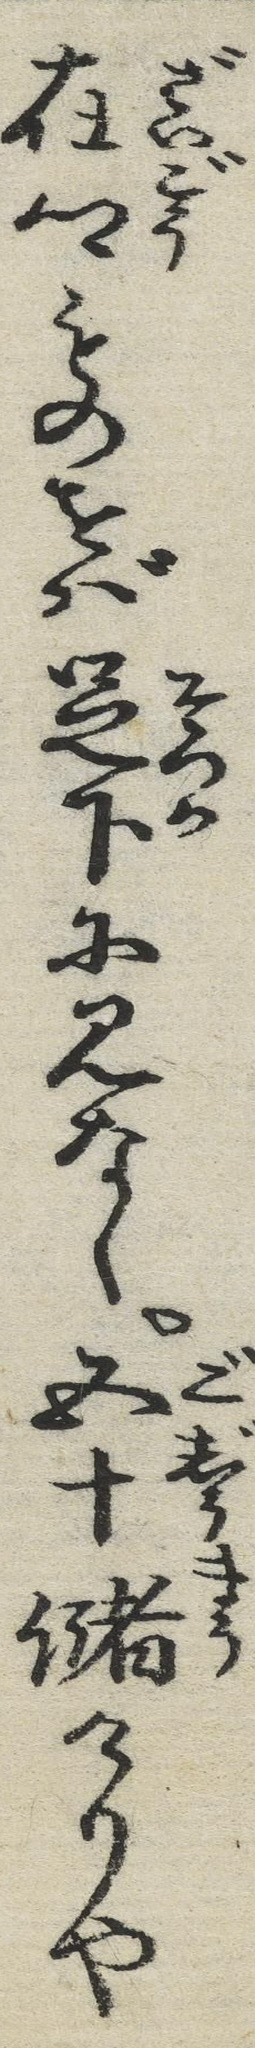在郷ものをば足下に見なし。五十儲けりや
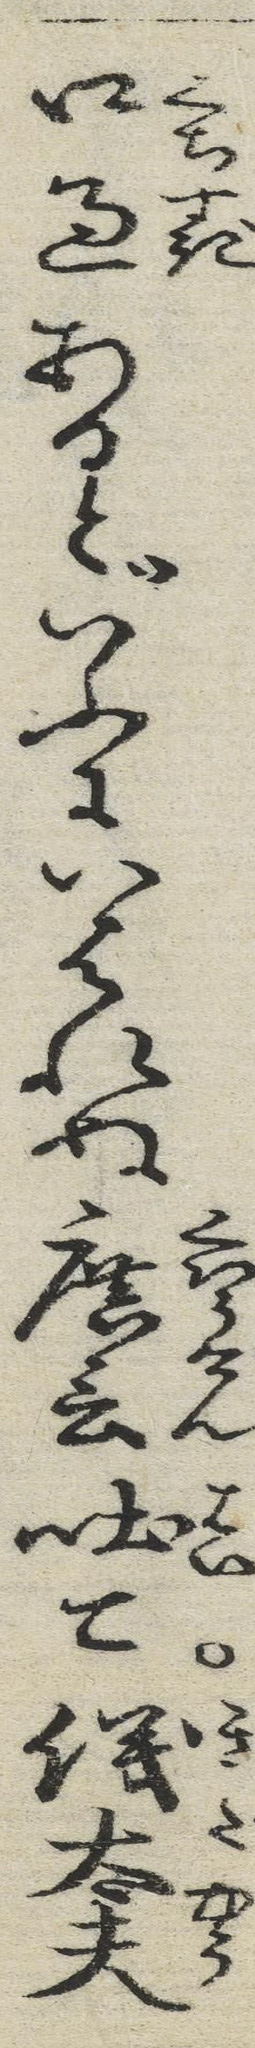口過あると。いふにいはれぬ広言吐て。義太夫
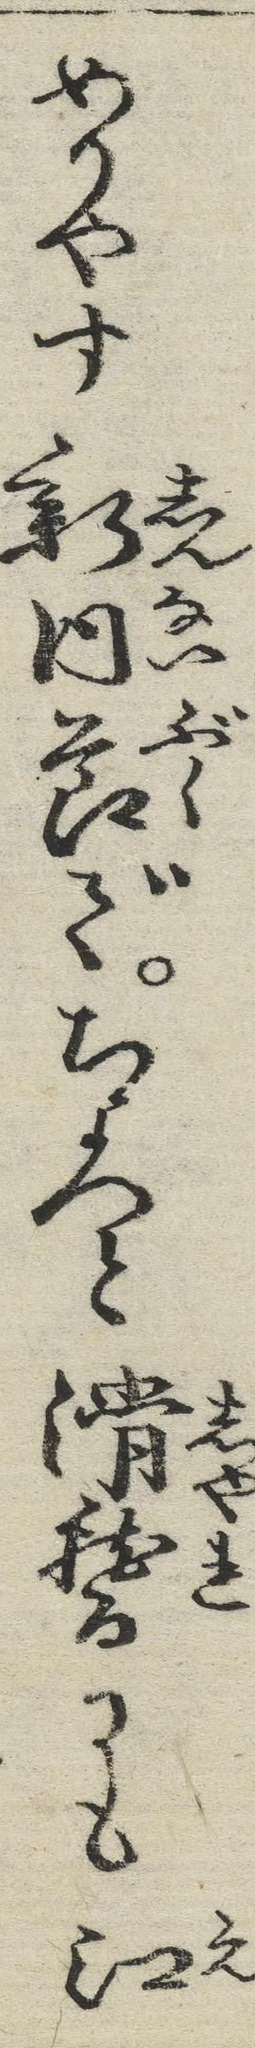めりやす新内節で。ちよつと滑稽にも江
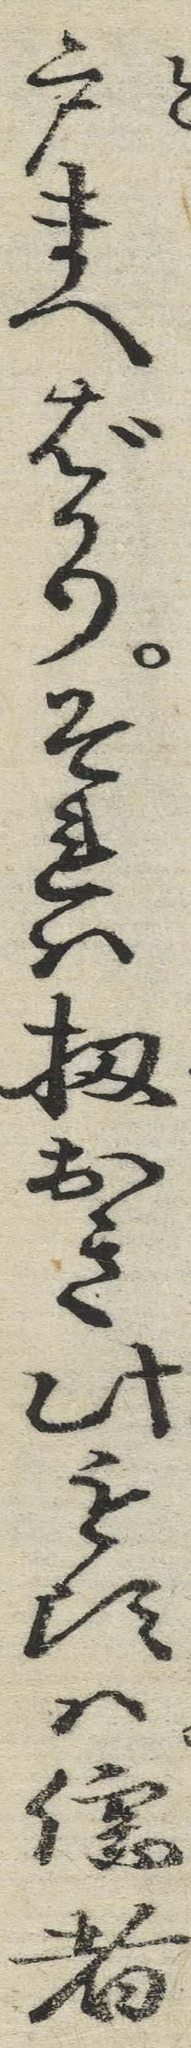戸まへばかり。それは扨おき此近頃は。儒者
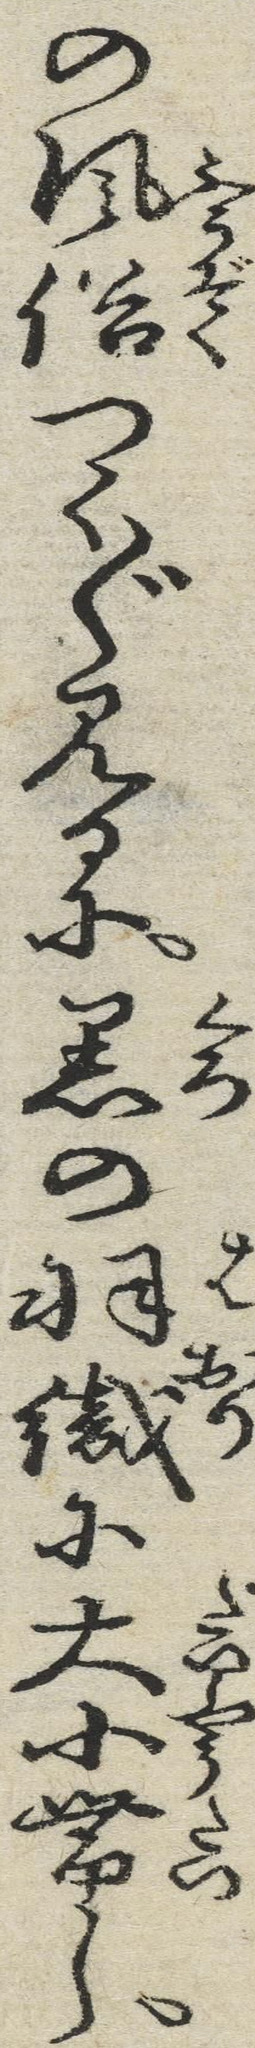の風俗つく〴〵見るに。黒の羽織に大小帯し。
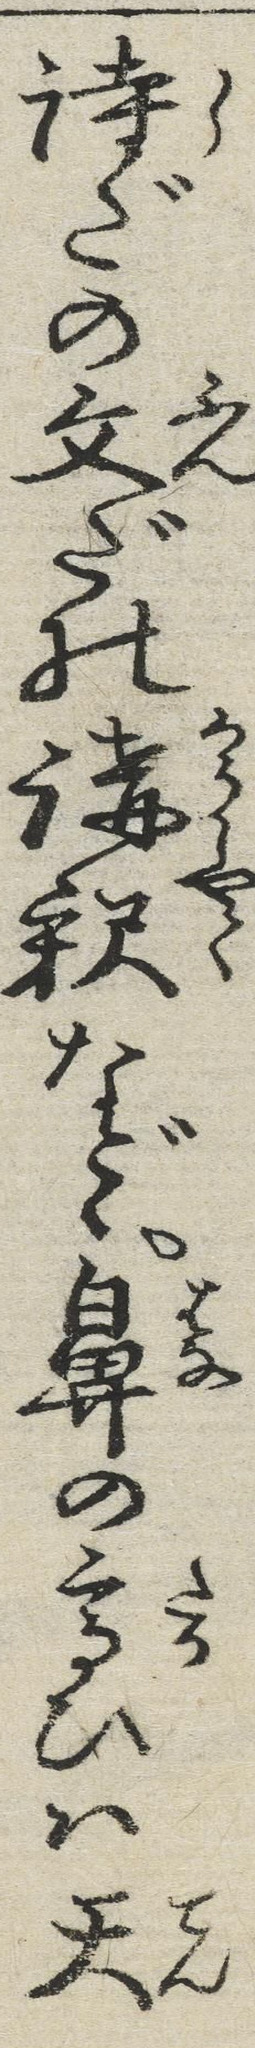詩だの文だの講釈などゝ。鼻の高ひは天
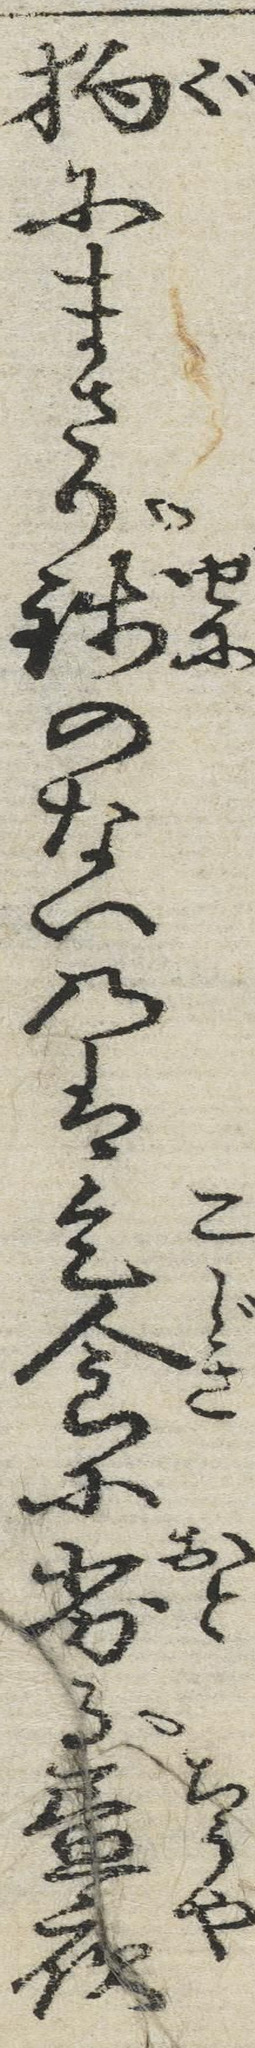狗にまさり。銭のないのは乞食に劣る。昼夜
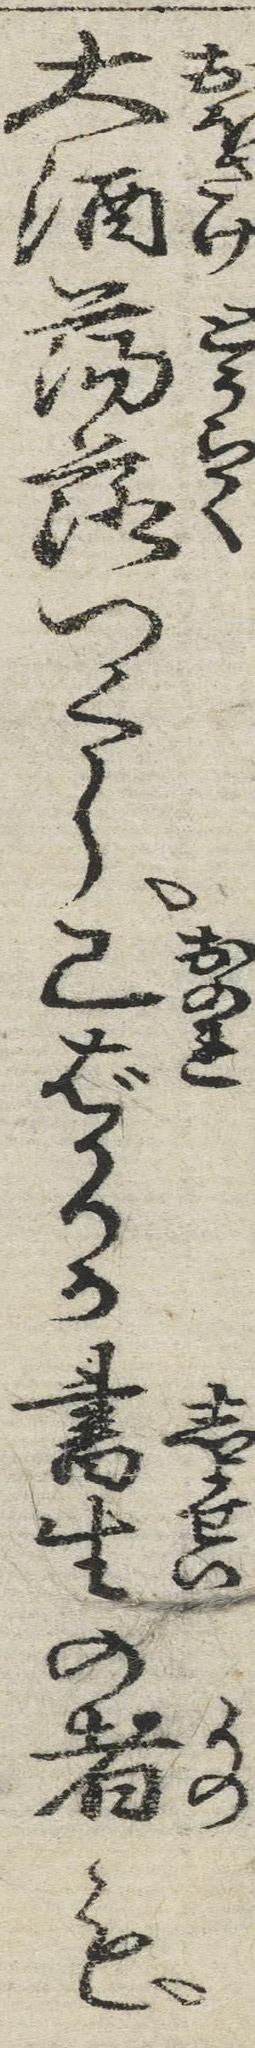大酒道楽つくし。己ばかりか書生の者も。
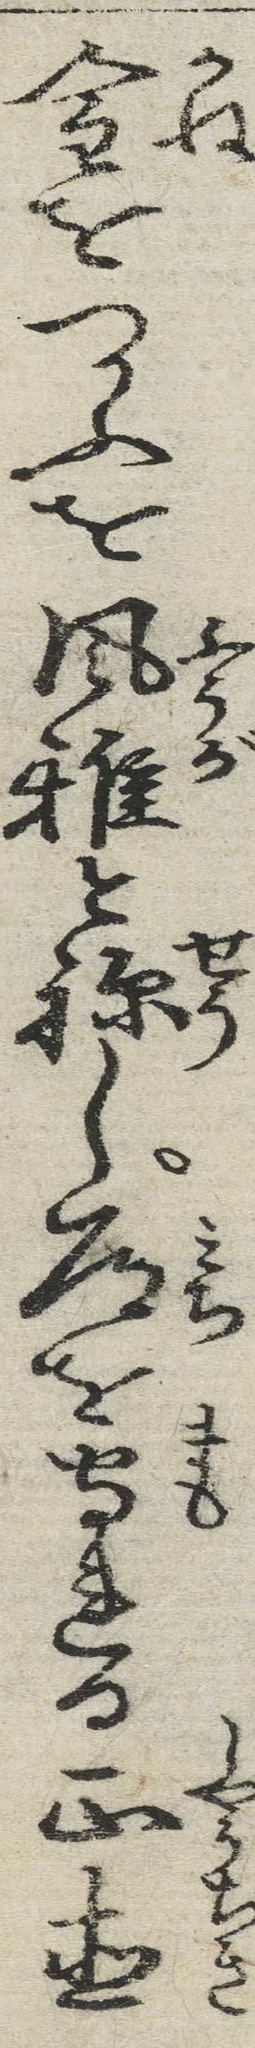金をつかふを風雅と称し。道を守れる正直
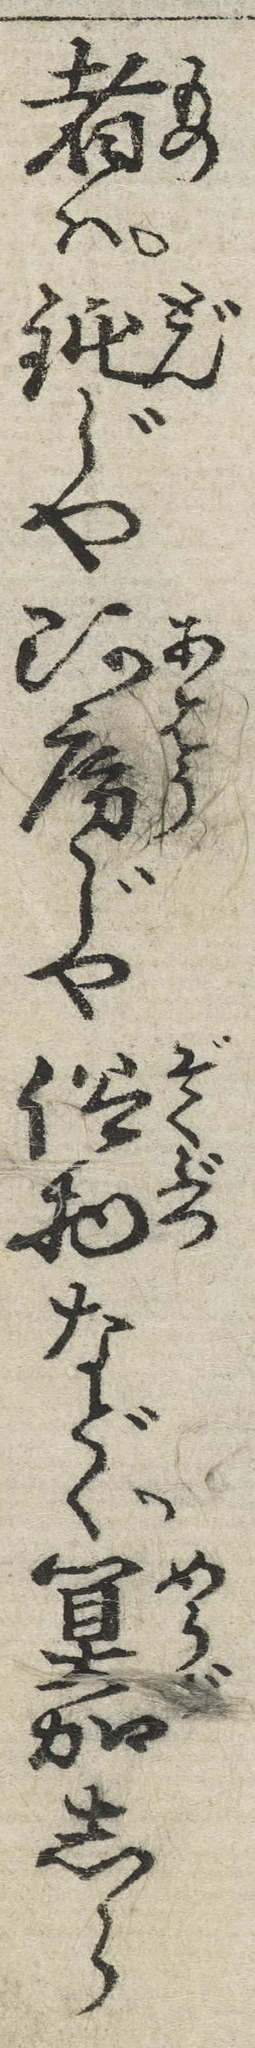者は。鈍じや阿房じや俗物などゝ。冥加しら
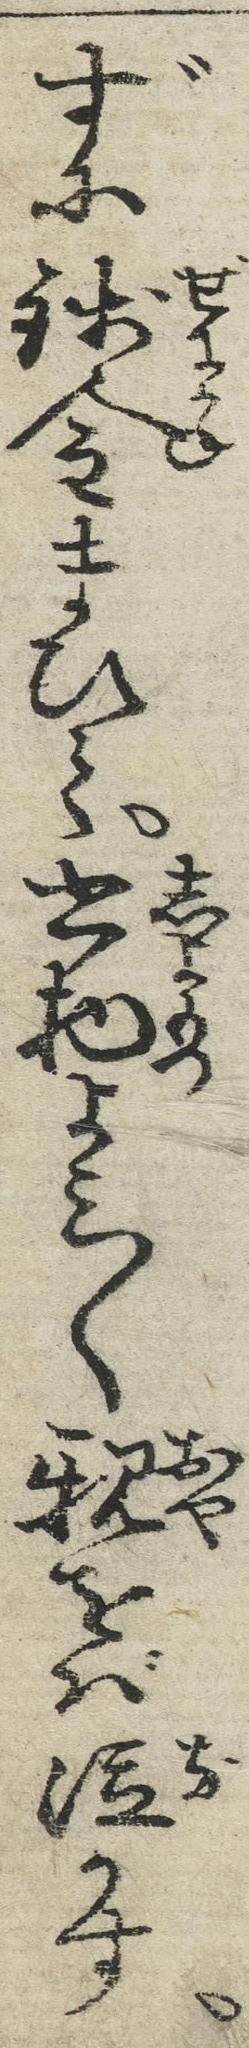ずに銭金まひて。書物にこつて親をば泣かす。

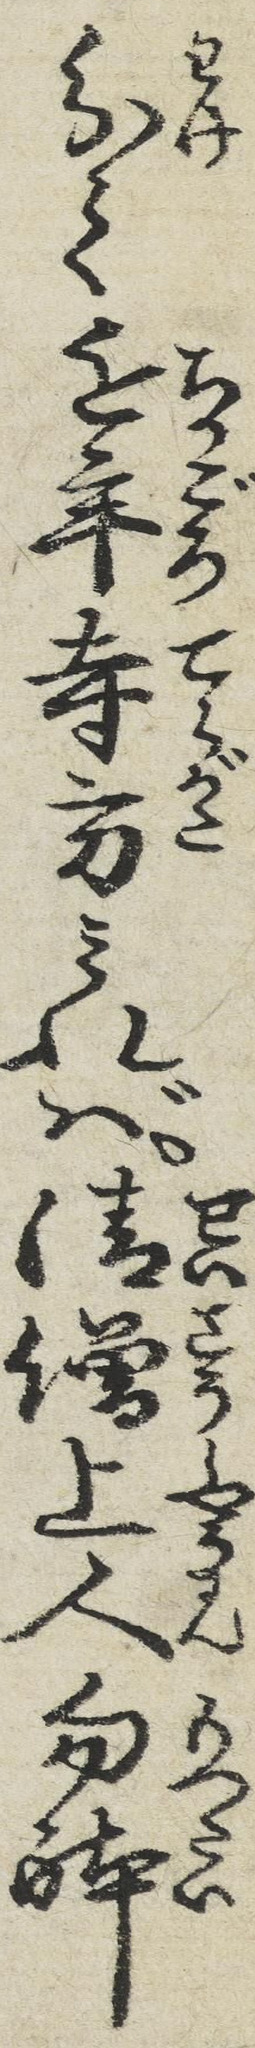分て近年寺方みれば。清僧上人勿体
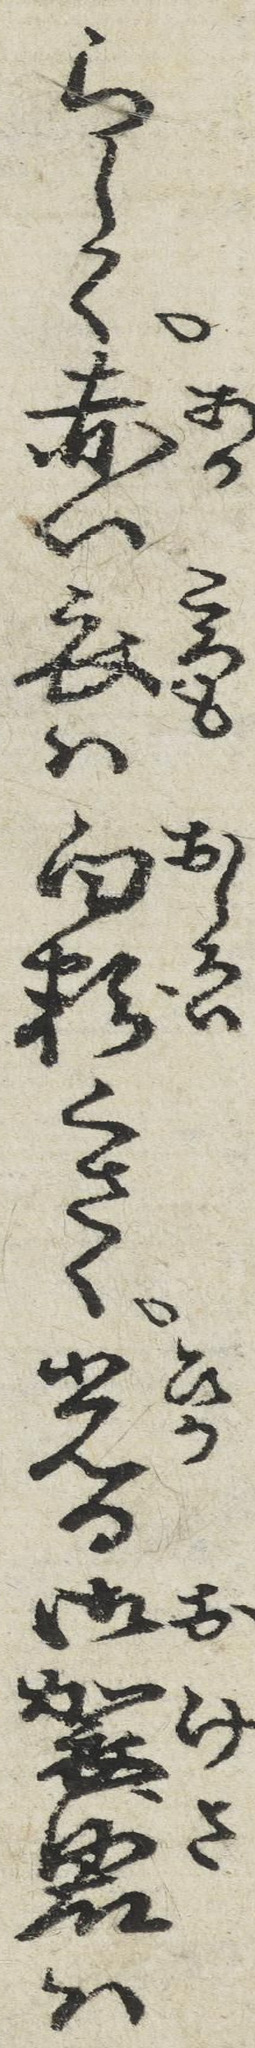らしく。赤き衣は白粉くさく。光る御袈裟は
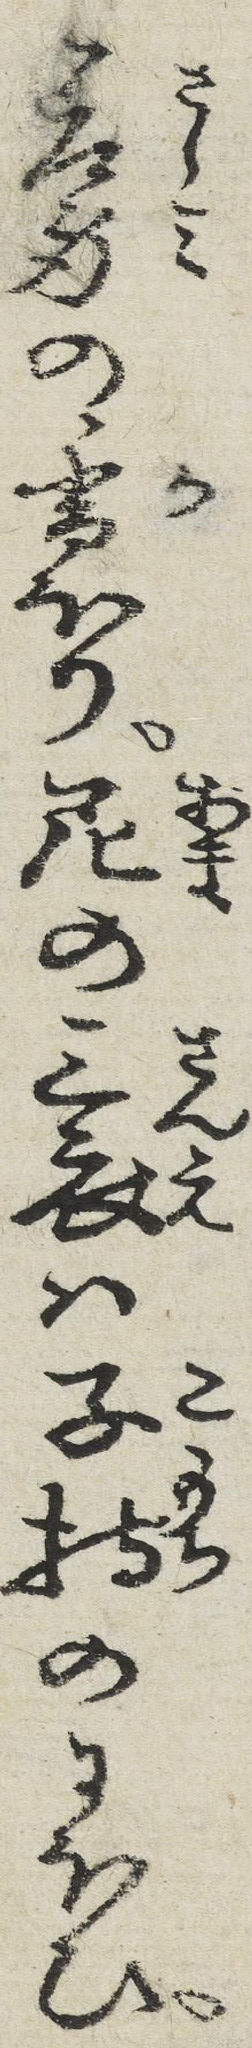刺身の香ほり。尼の三衣は子持のにほひ。
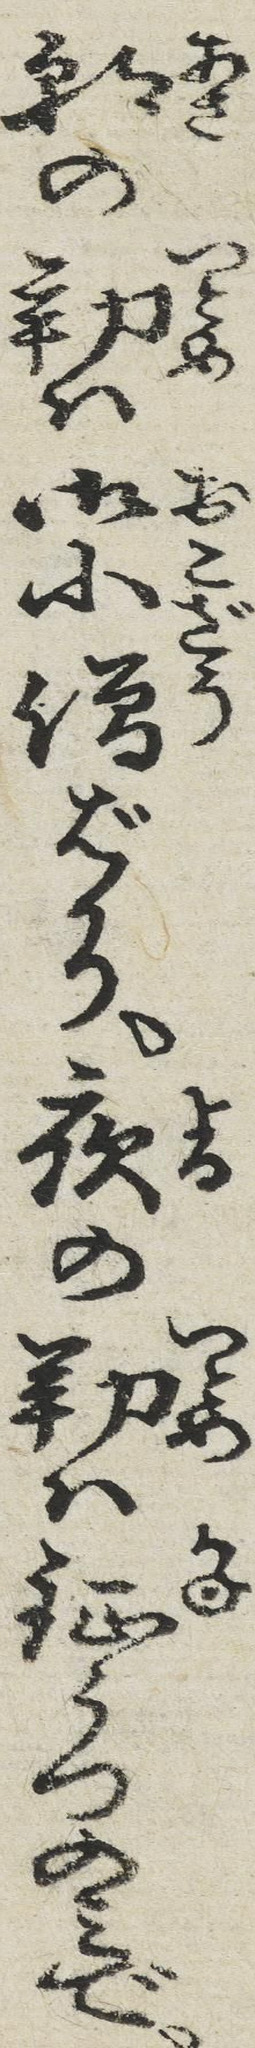朝の勤は御小僧ばかり。夜の勤は鉦うつのみで
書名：越後地震口説
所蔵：東京大学地震研究所図書室 Earthquake Research Institute Library, The University of Tokyo, JAPAN
